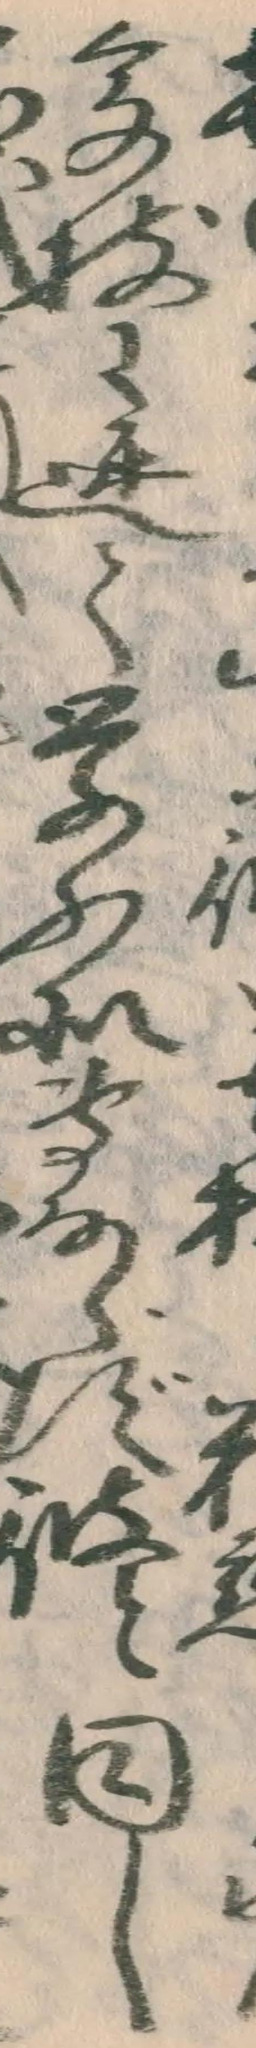多技に遅て学ふ処専ならず彼と同し
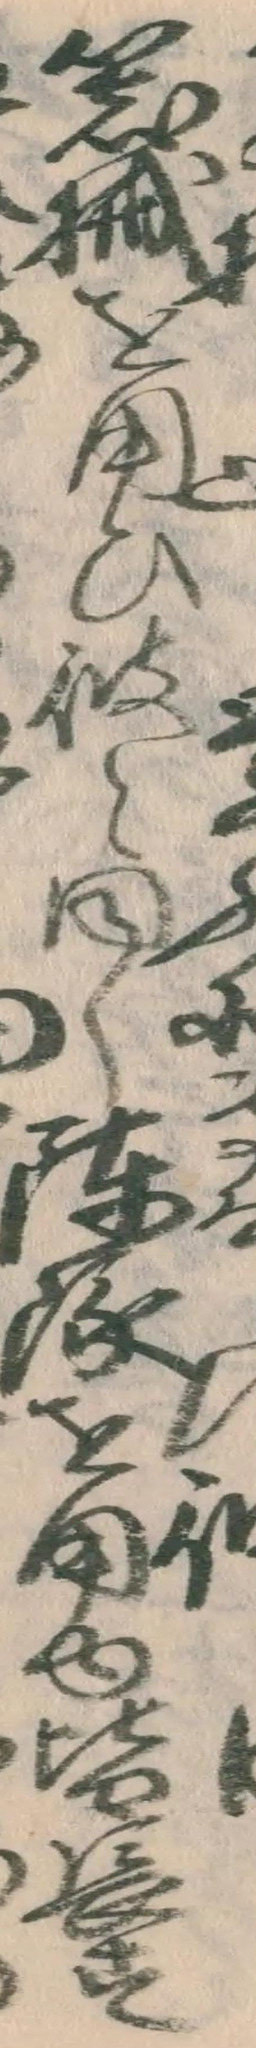器械を用ひ彼と同し陣隊を用ゆ皆長す
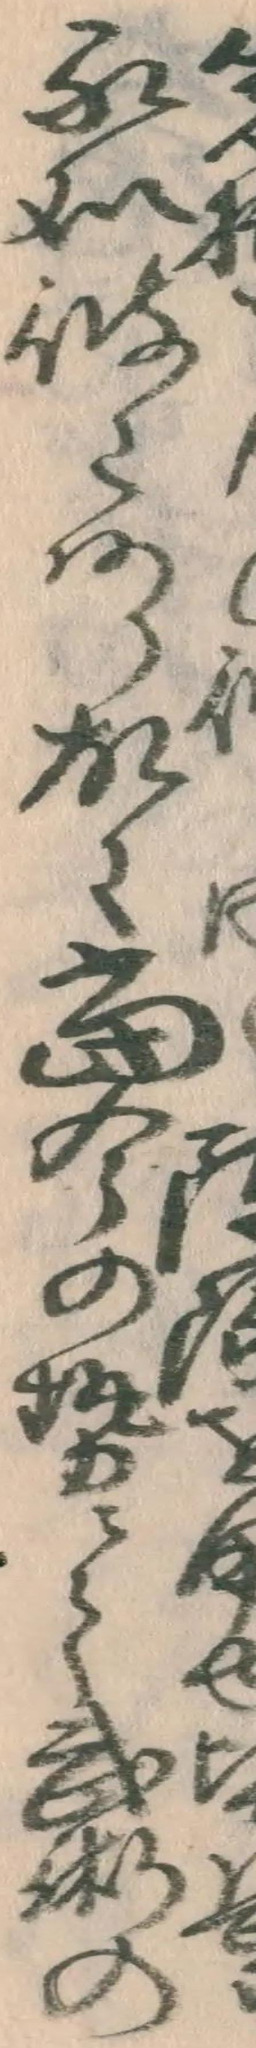る処彼にあり故に當今の勢ニて武術の
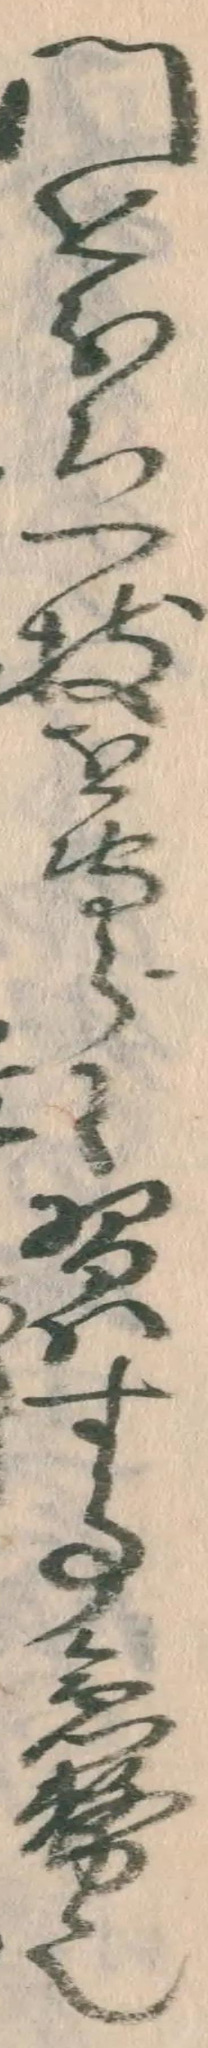門を分ち一技を専らに習ハす事急務也
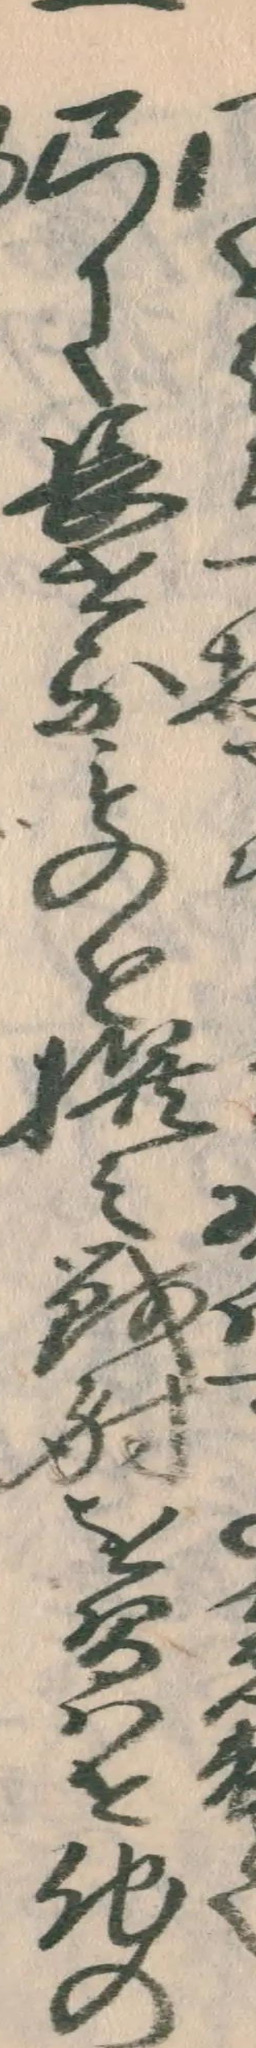一弓に長せるものを撰ミ戦射を習ハせ他の
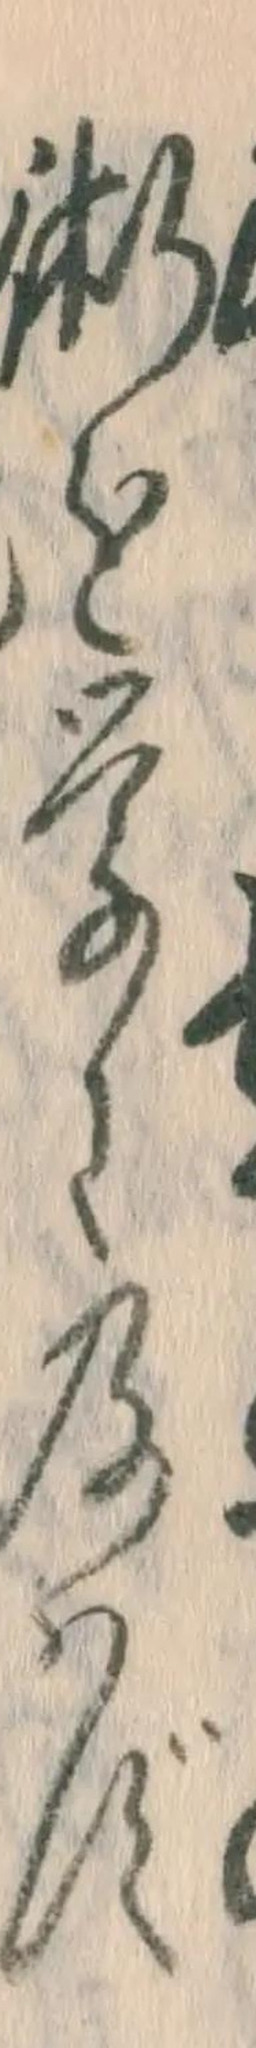術を学に及ハず
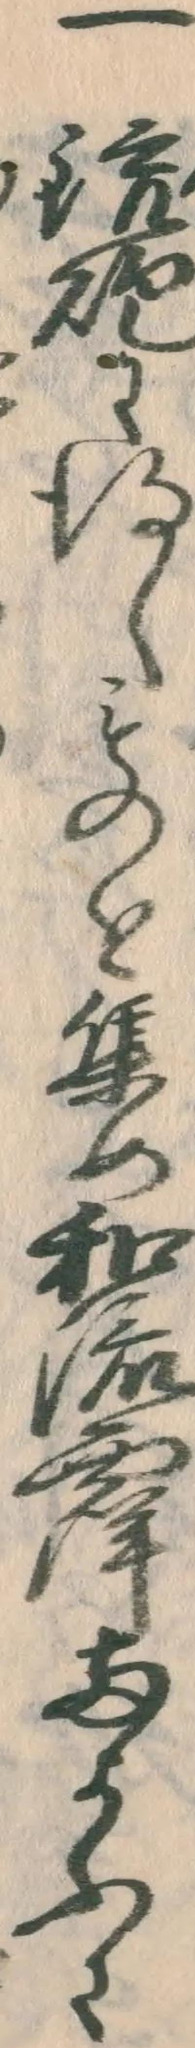一銃砲に得しものを集め和流西洋両よふに
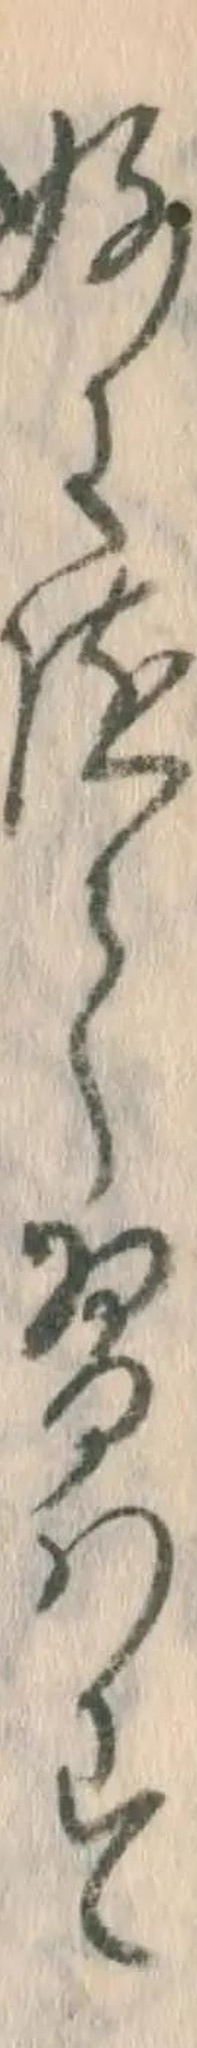好に随て習ハす
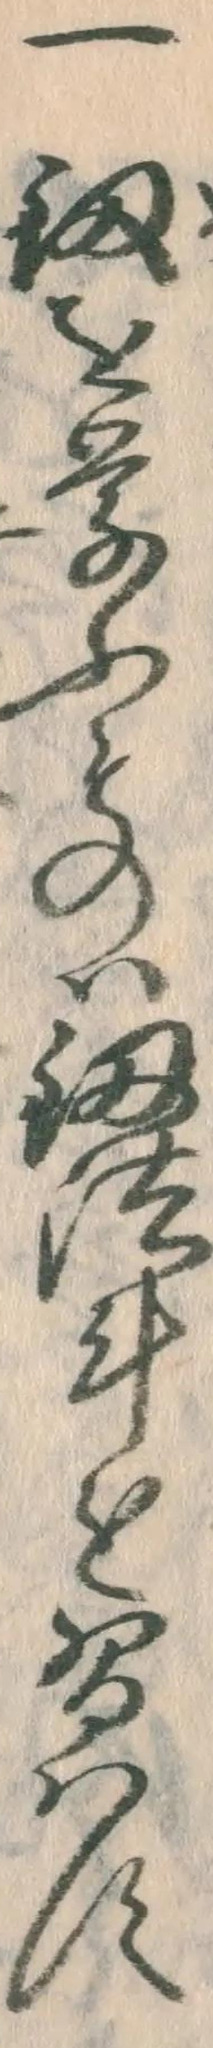一剱を学ふものハ剱法斗を習ハす
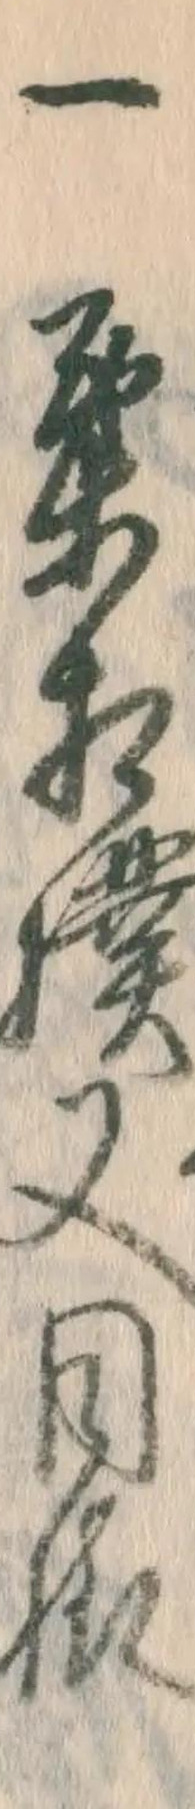一柔相撲又同様
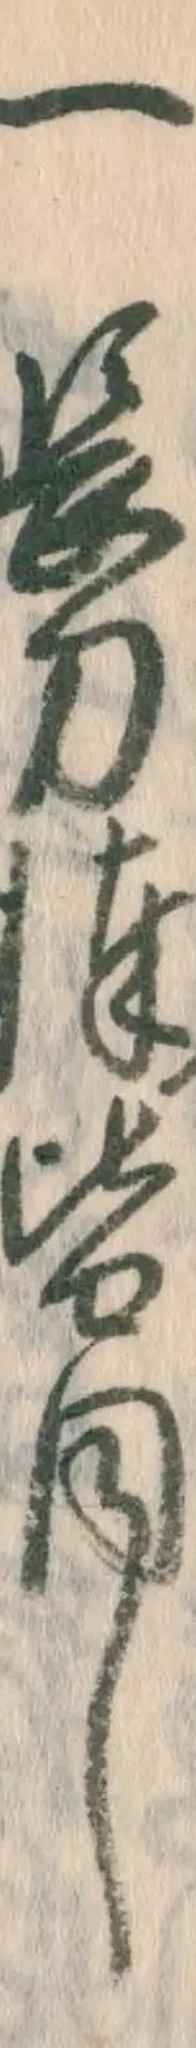一長刀棒皆同し
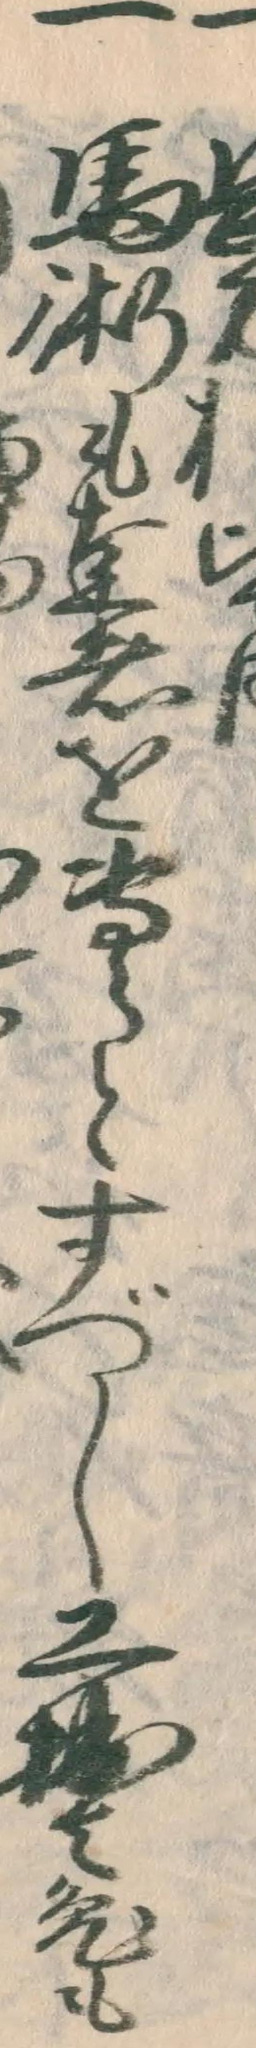一馬術も達者を専らとすべし工拙は兎も
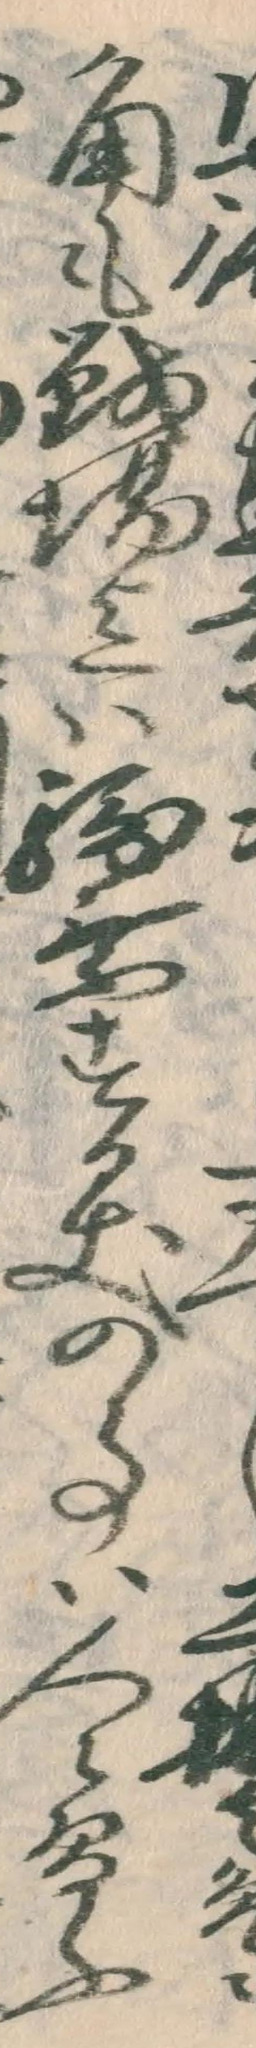角も戦場迄ハ騎乗する丈の事ハ人々習ふ
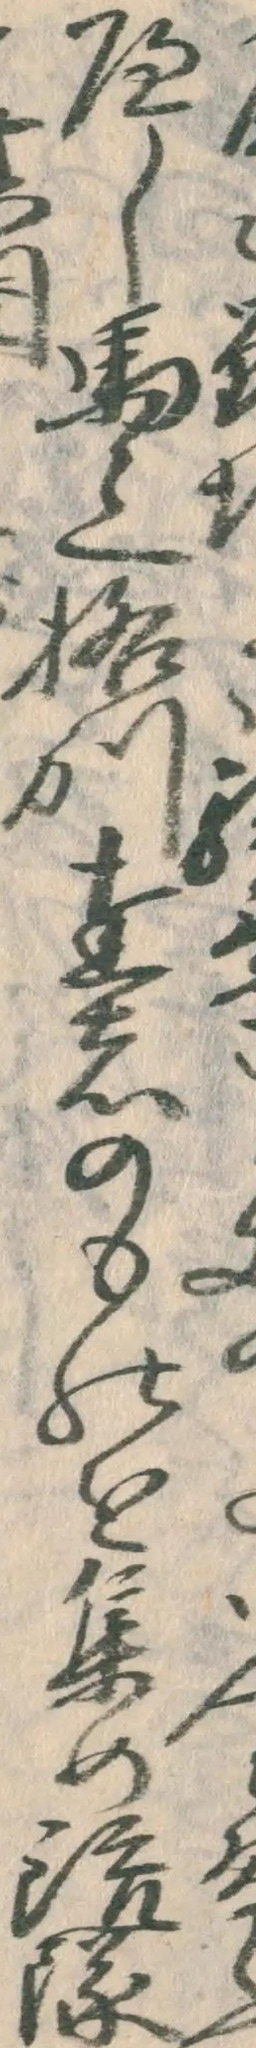へし馬上格別達者のものを集め銃隊
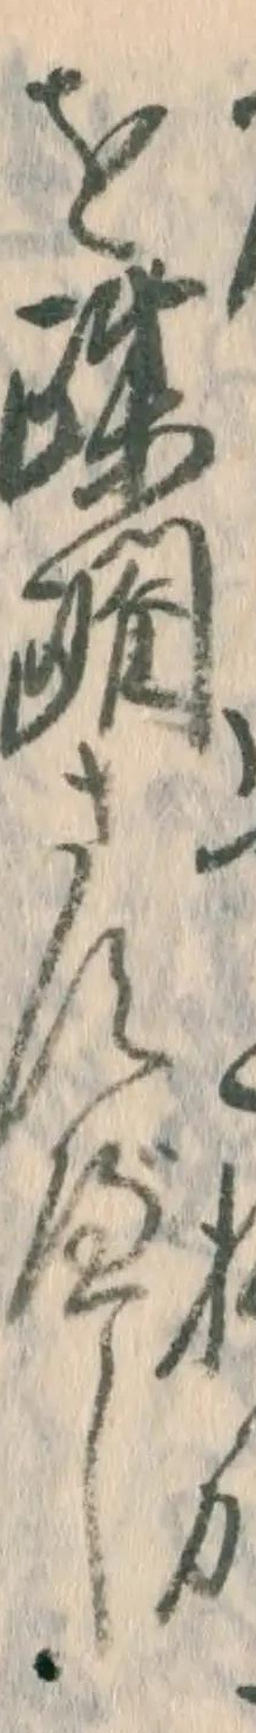を蹂躙さすべし
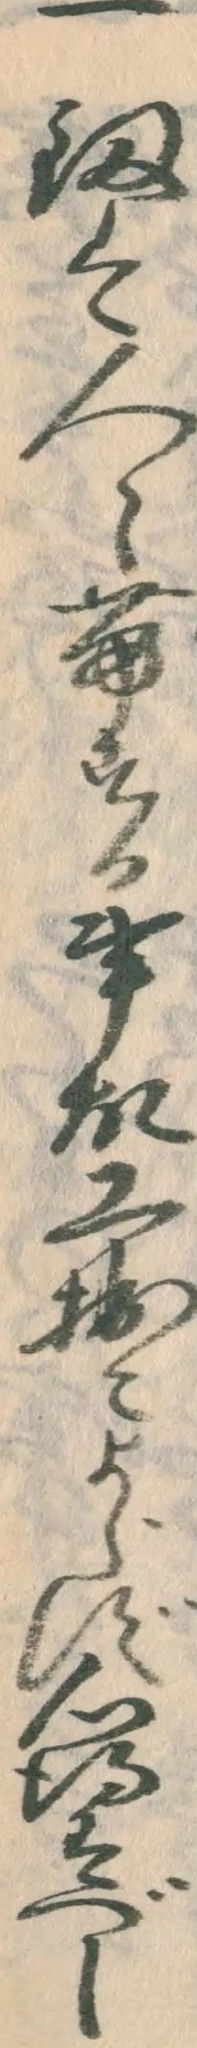一剱は人々帯する事故工拙ニよらず心得有べし
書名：麗斎叢書. 20
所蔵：国立国会図書館 National Diet Library, JAPAN
